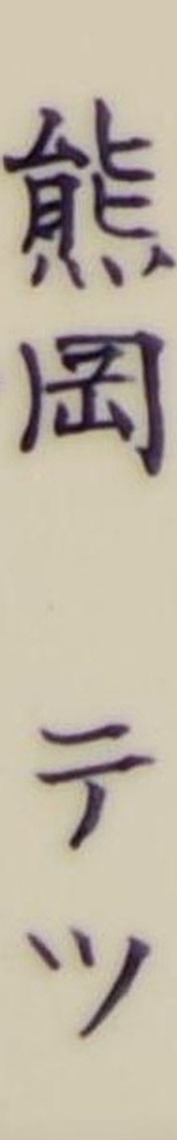熊岡テツ
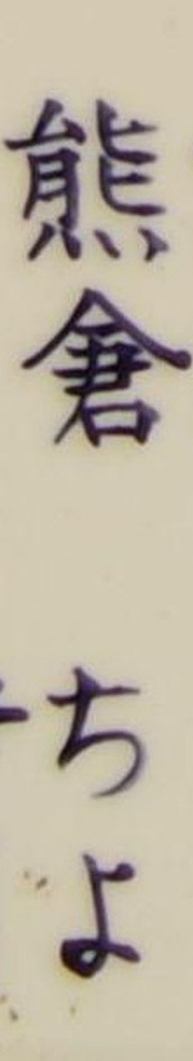熊倉ちよ

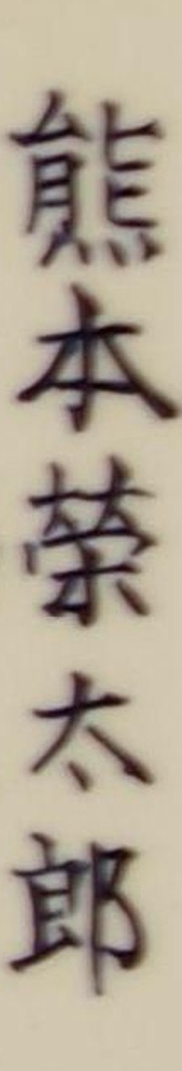熊本榮太郎
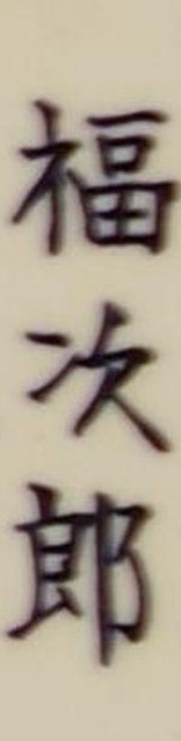福次郎
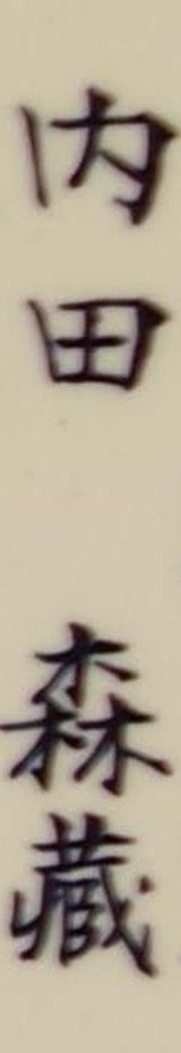内田森藏
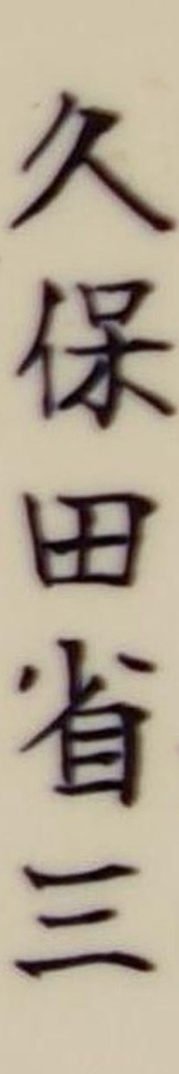久保田省三
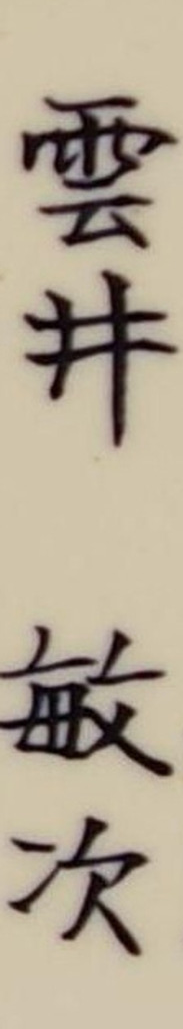雲井敏次
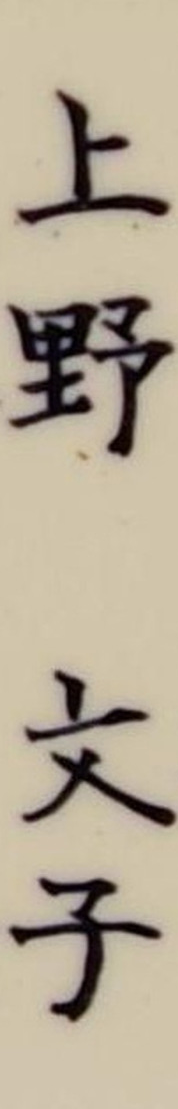上野文子
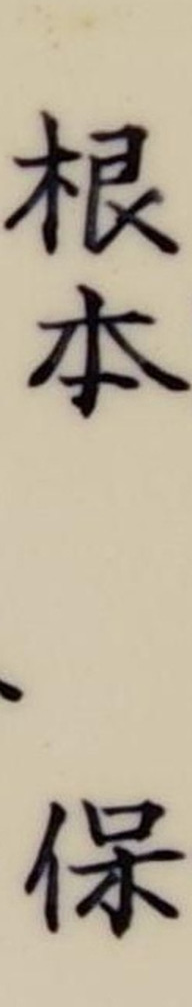根本保
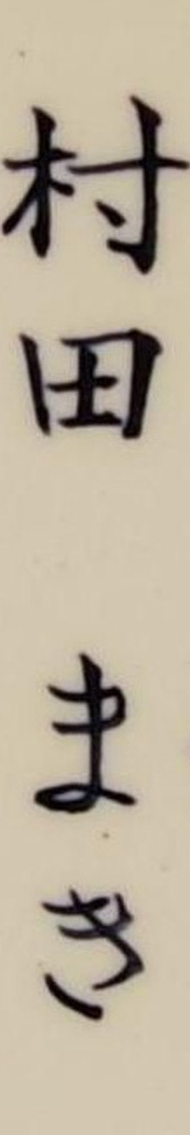村田まき
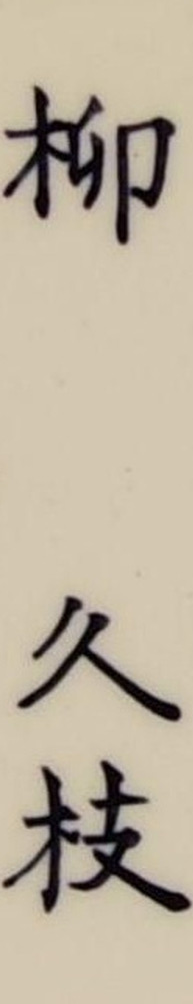柳久枝
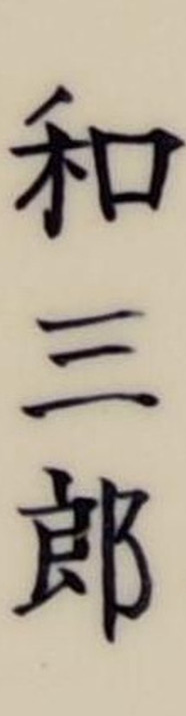和三郎
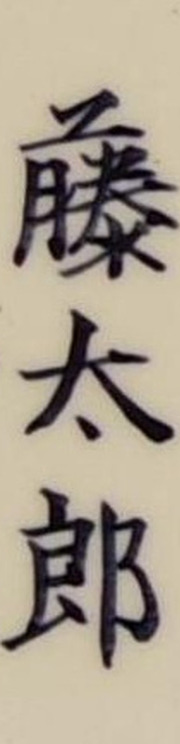藤太郎
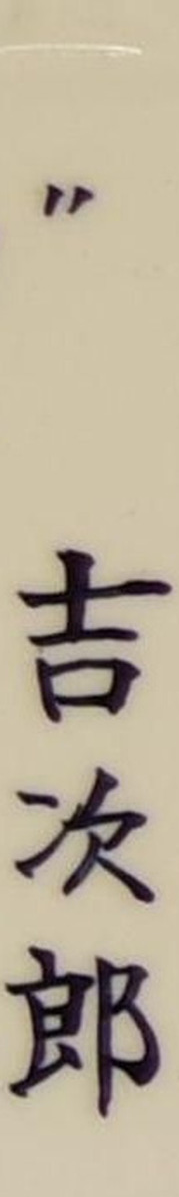吉次郎
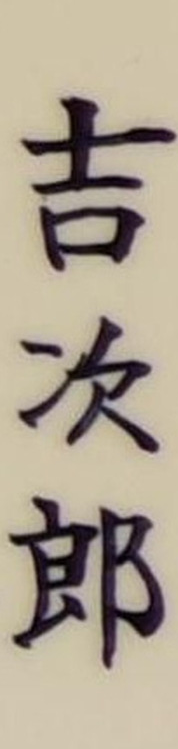吉次郎
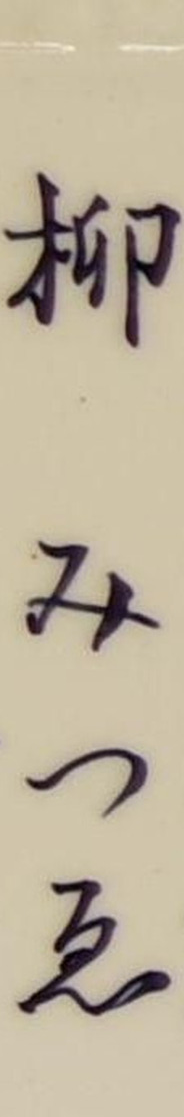柳みつゑ
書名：A~D
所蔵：koyasan kongobuji
